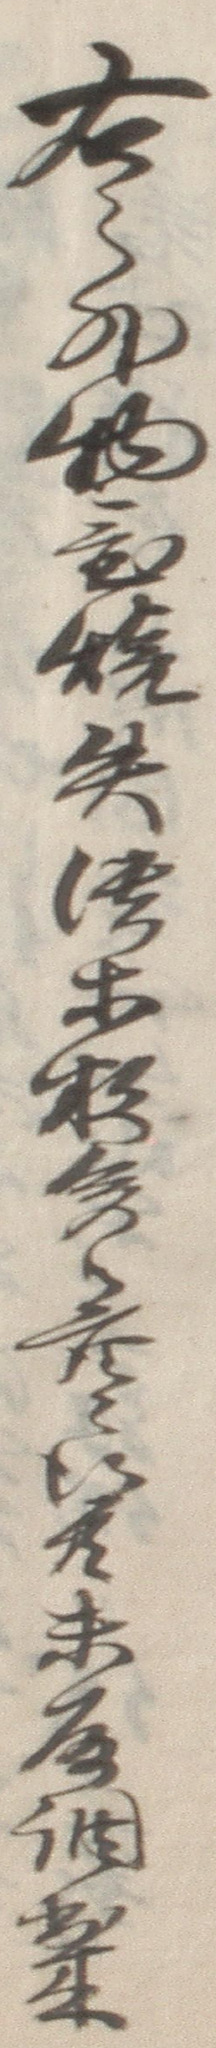右之外物置焼失潰等数多御座候得共未取調出来
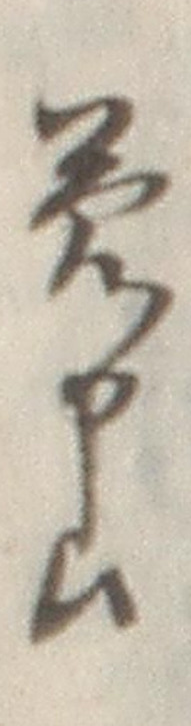兼申候
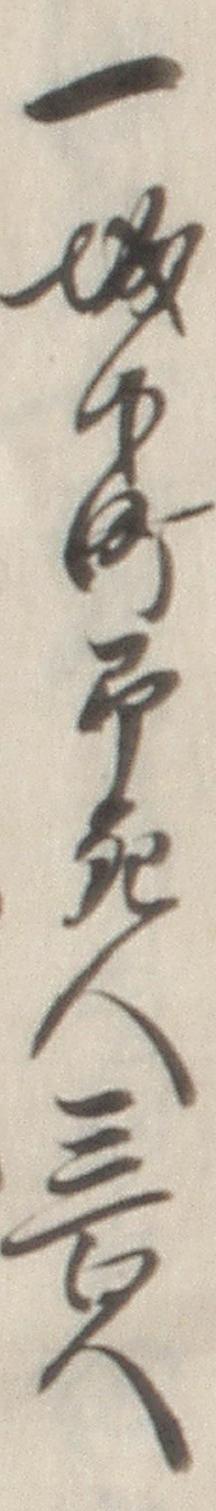一城下町即死人三百人
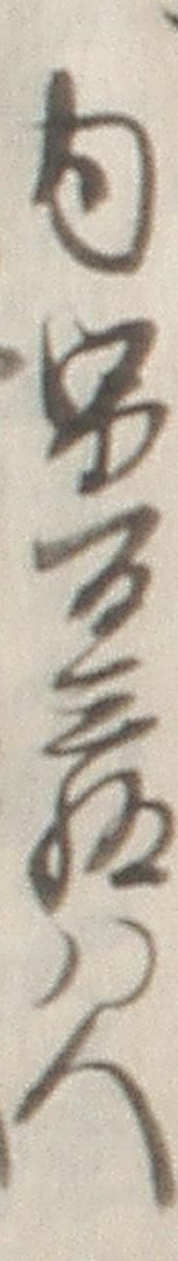内男百三拾八人
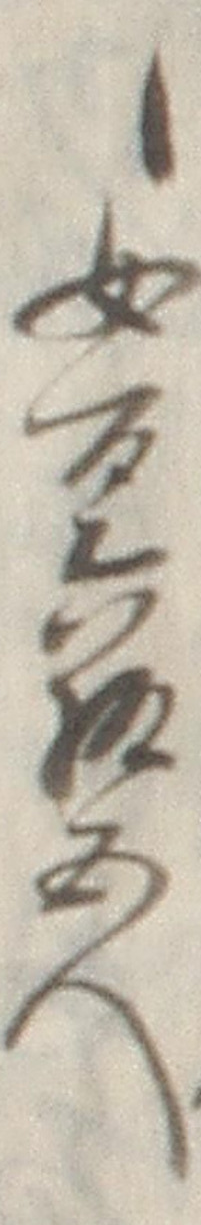女百六拾五人
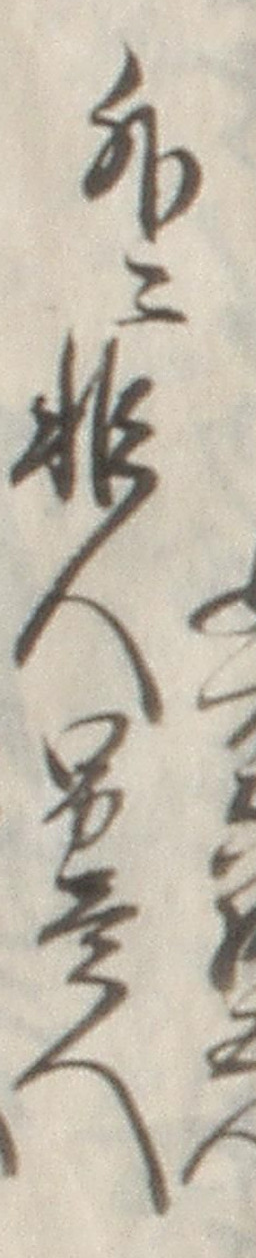外二非人男壱人
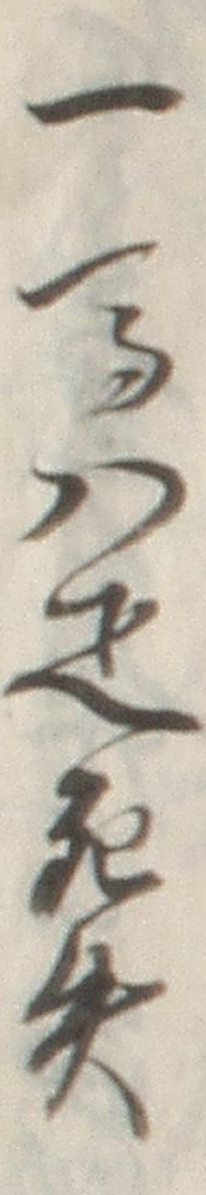一馬八疋死失

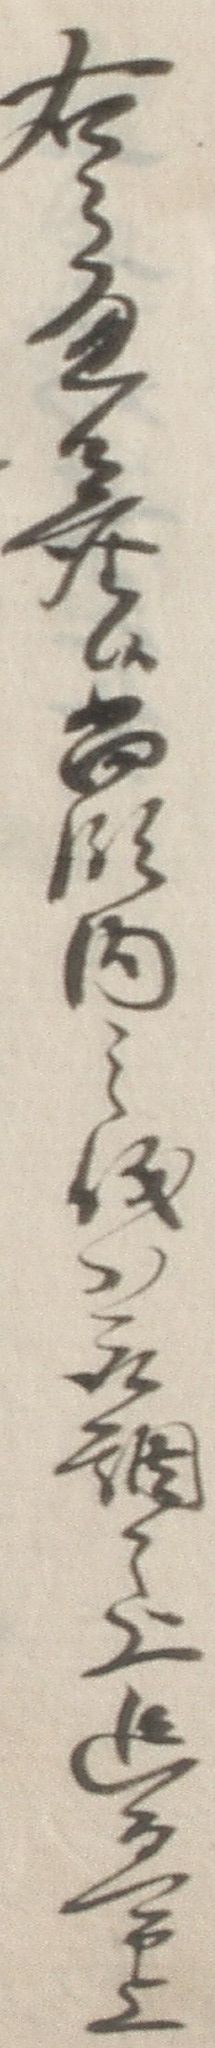右之通御座候尚領内之儀ハ取調之上追而可申上
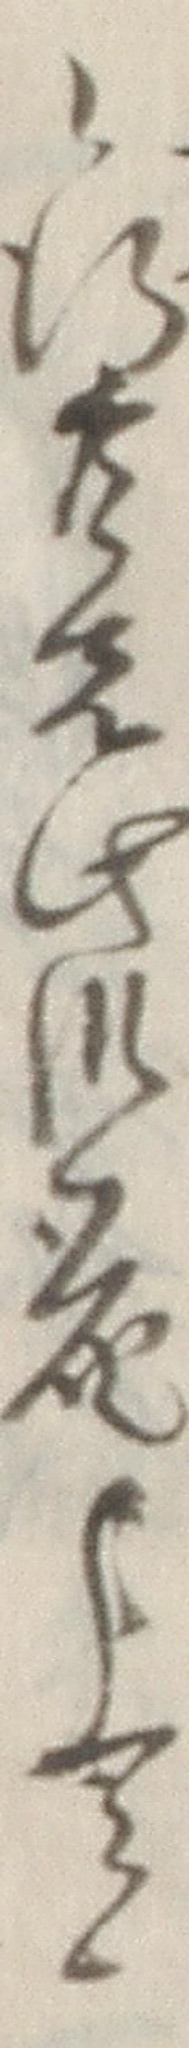候得共先此段御届申上候以上
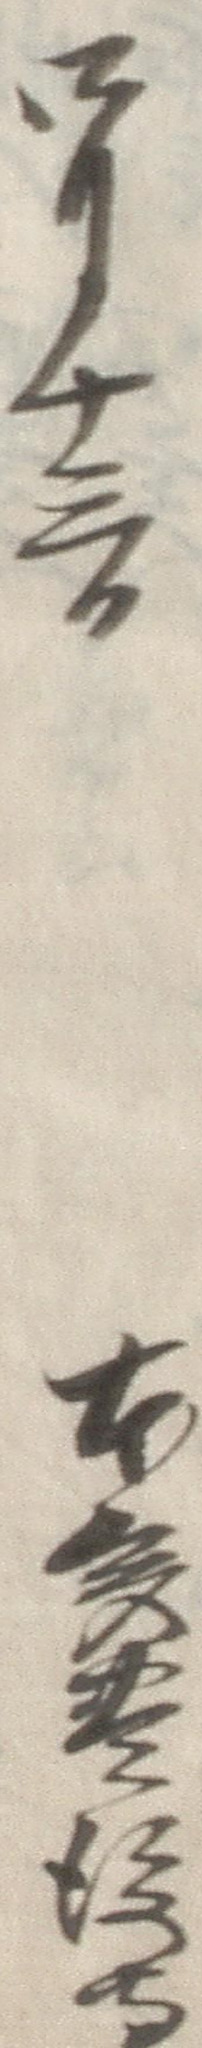四月十三日本多豊後守
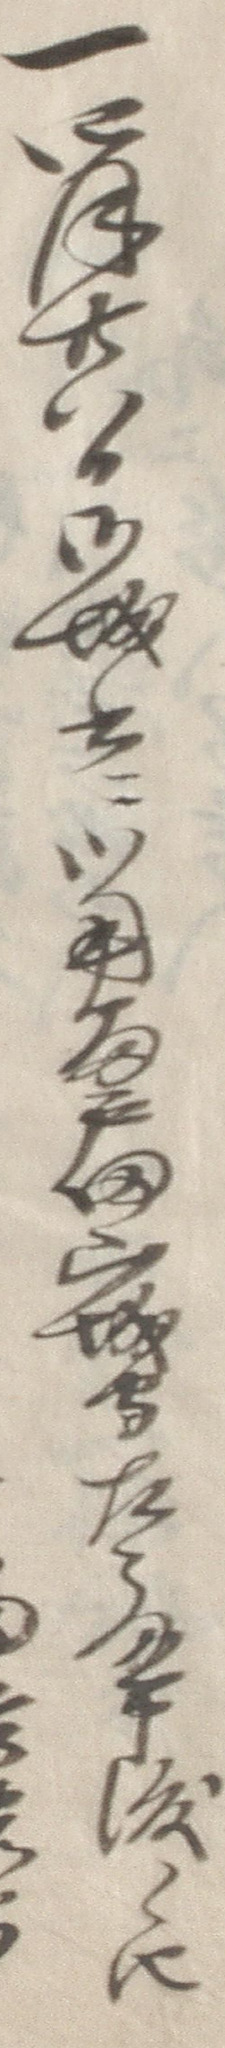一四月廿八日御城書二御用番戸田山城守左之通申渡候由
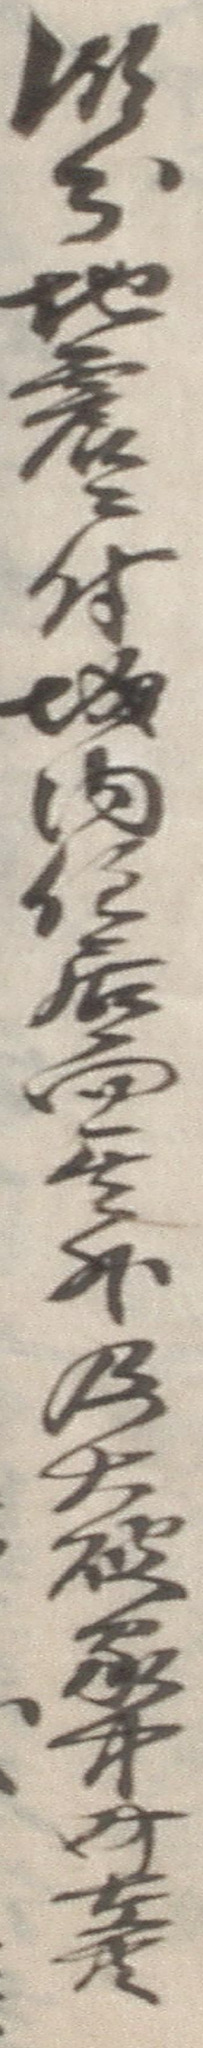領分地震二付城内住居向其外及大破家中町在共
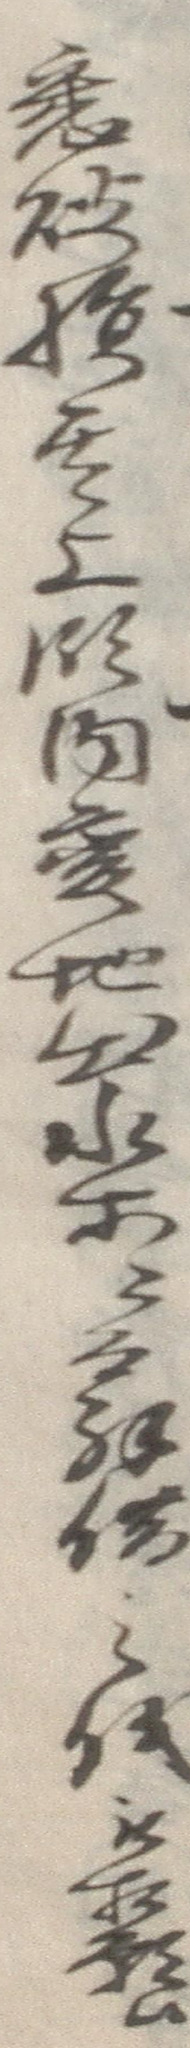悉破損其上領内変地出水等二而拝借之儀被相願候
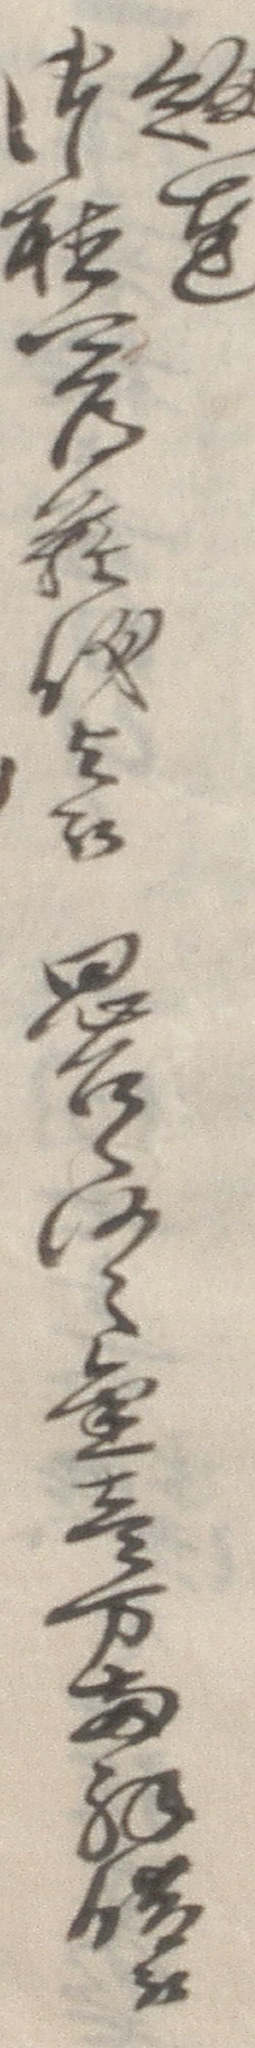御聴可為難儀と被思召候仍之金壱萬両拝借被
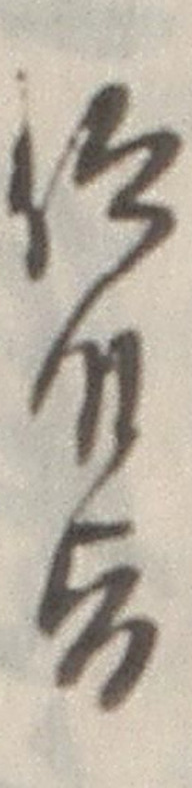仰付旨
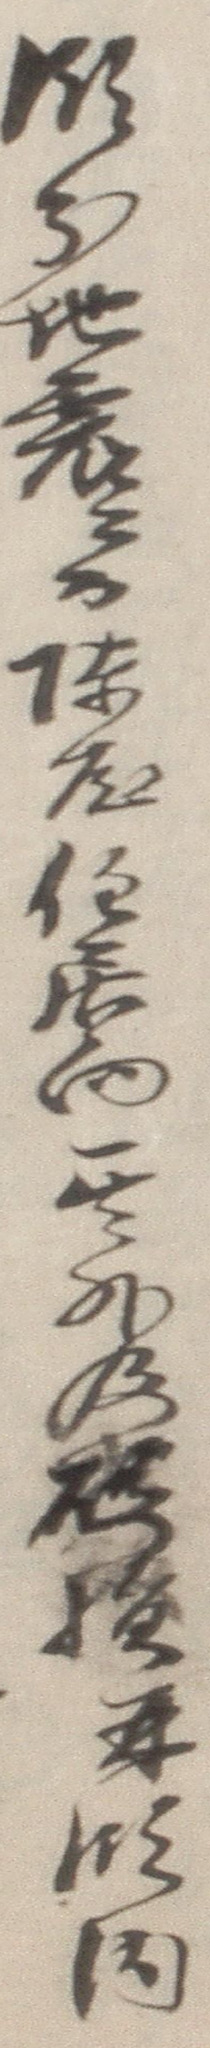領分地震二而陣屋住居向其外及破損并領内
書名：信州地震一件
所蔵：東京大学地震研究所図書室 Earthquake Research Institute Library, The University of Tokyo, JAPAN
